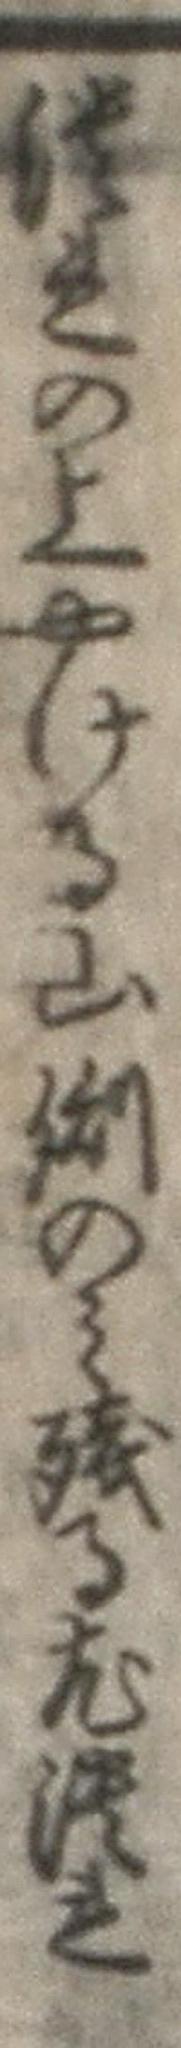潰れの上やける山側のみ残る尤潰れ
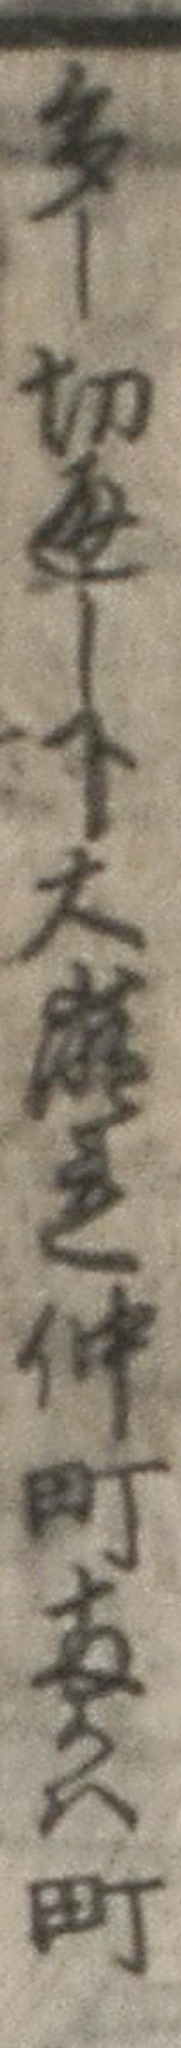多し切通し下大崩れ仲町両かは町
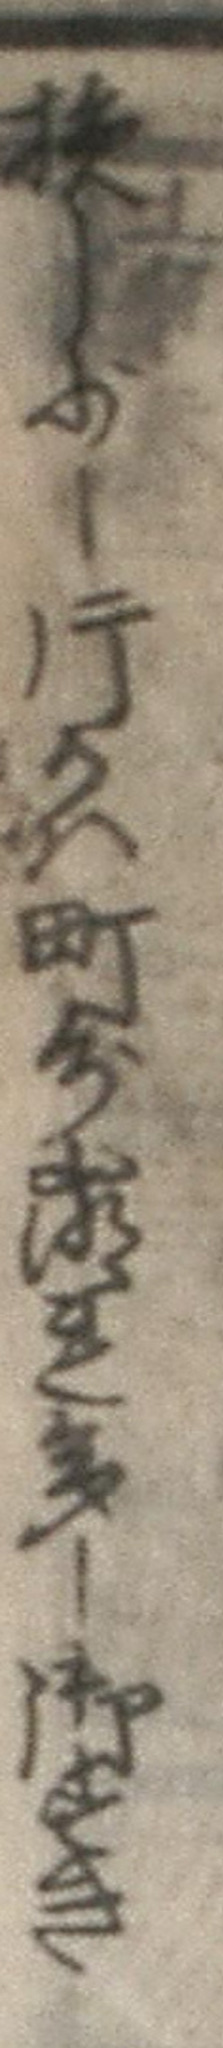損し少し片かは町分崩れ多し御すき
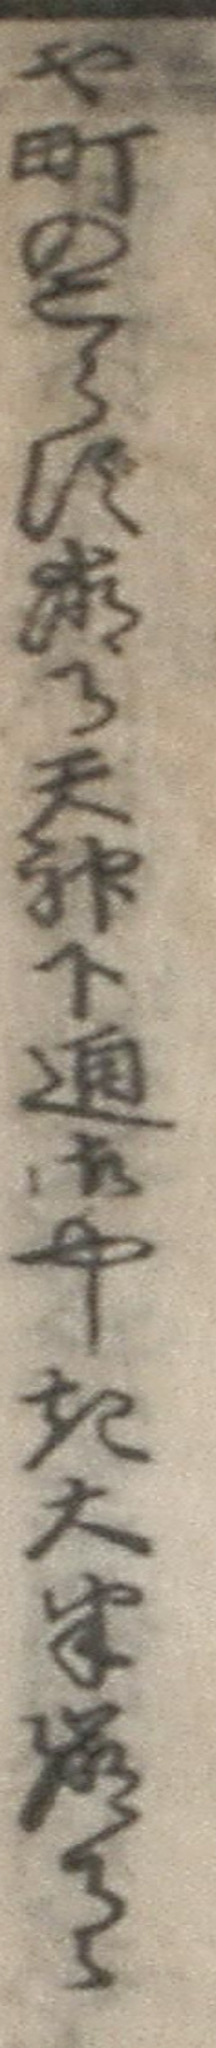や丁のこらす崩る天神下通御やしき大半崩るゝ
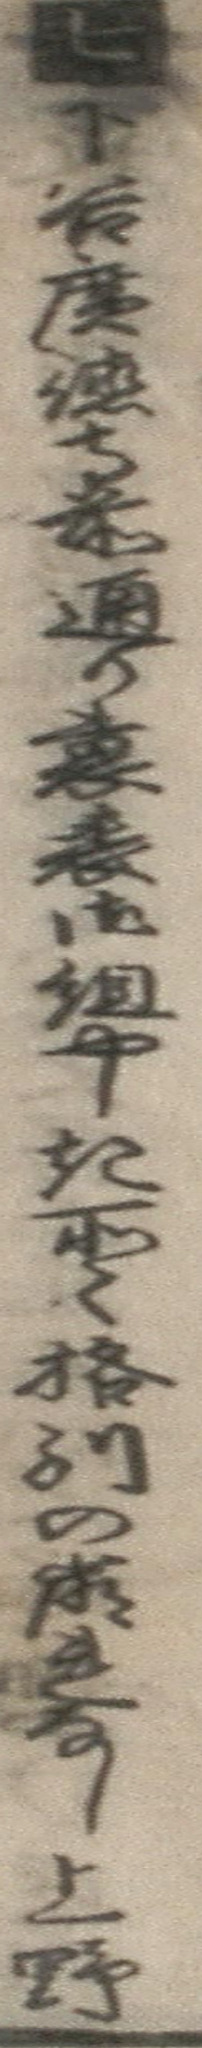七下谷廣徳寺前通り裏表御組やしき所〻格別の崩れなし上野
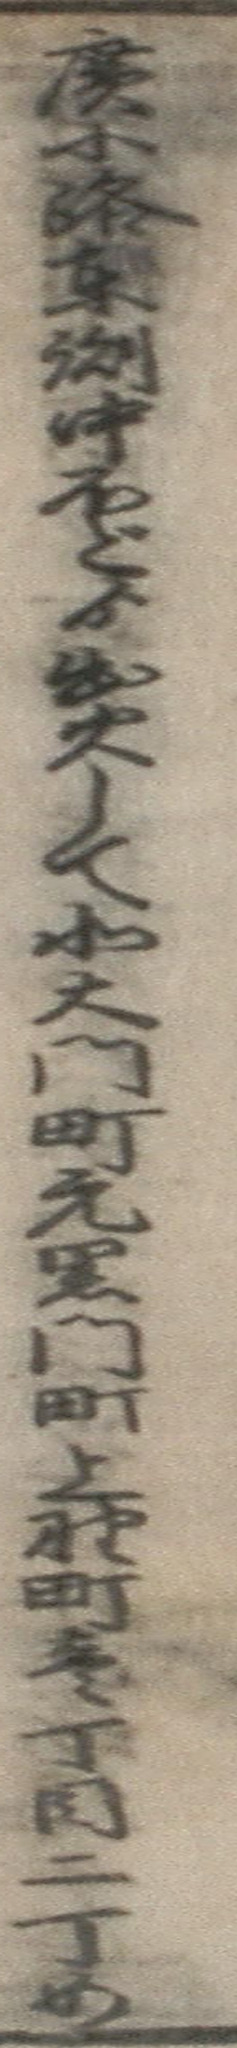廣小路東側中ほどゟ出火して北大門町元黒門町上野町一丁目二丁め
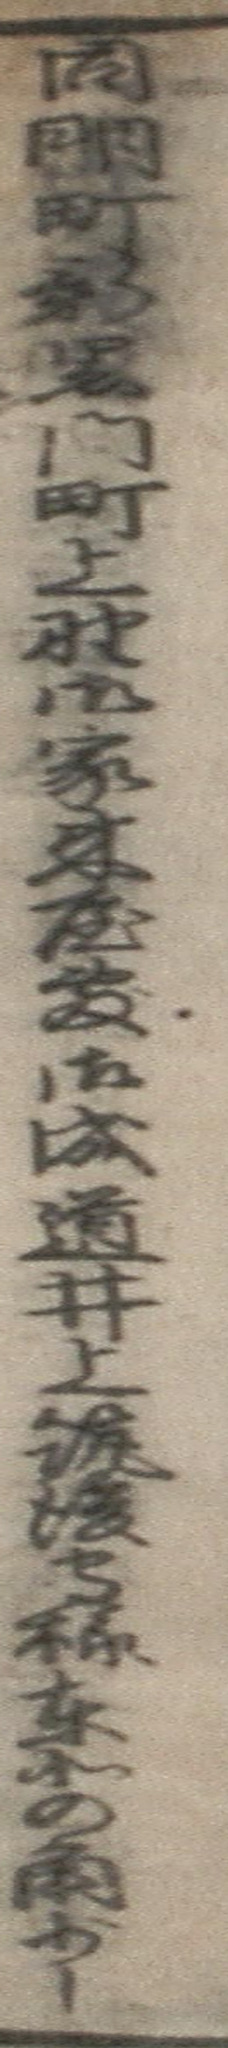同朋町新黒門町上野御家来屋敷御成道井上筑後守様東北の角少し
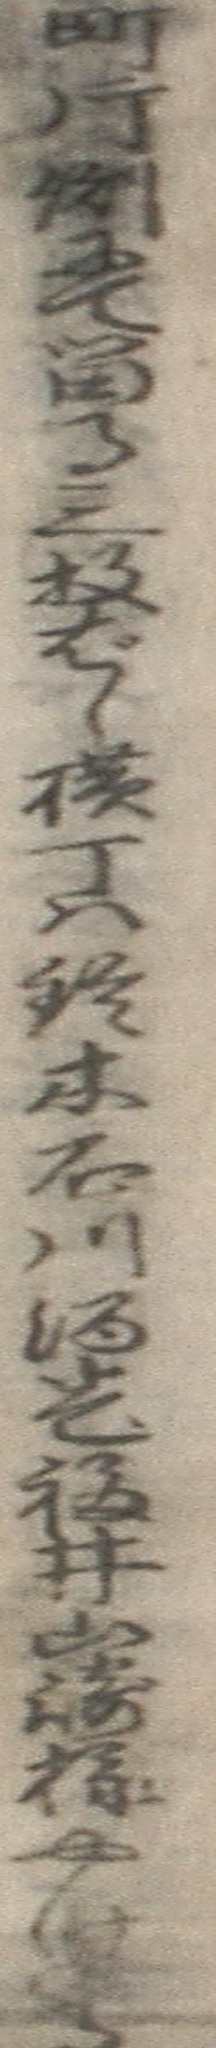町片側にて留る三枚ばし横丁は鈴木石川酒巻福井山崎様やける
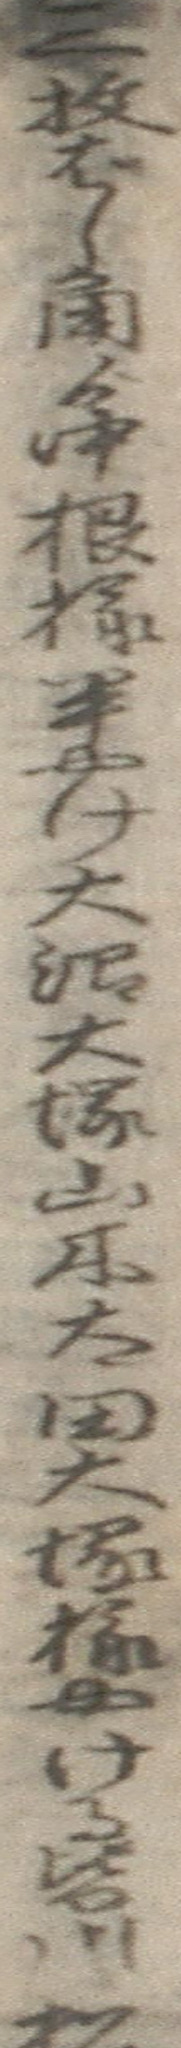三枚ばし角ゟ中根様半やけ大沼大塚山木太田大塚様やける皆川松
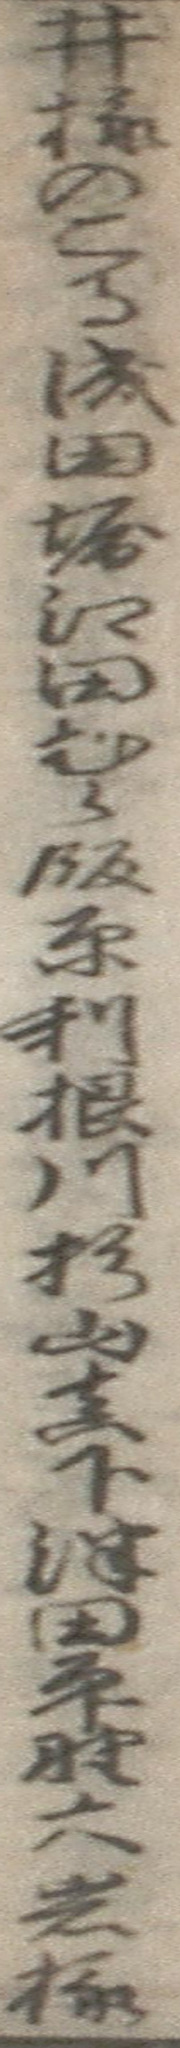井様のこる成田堀江田むら飯原利根川杉山真下津田平野大岩様
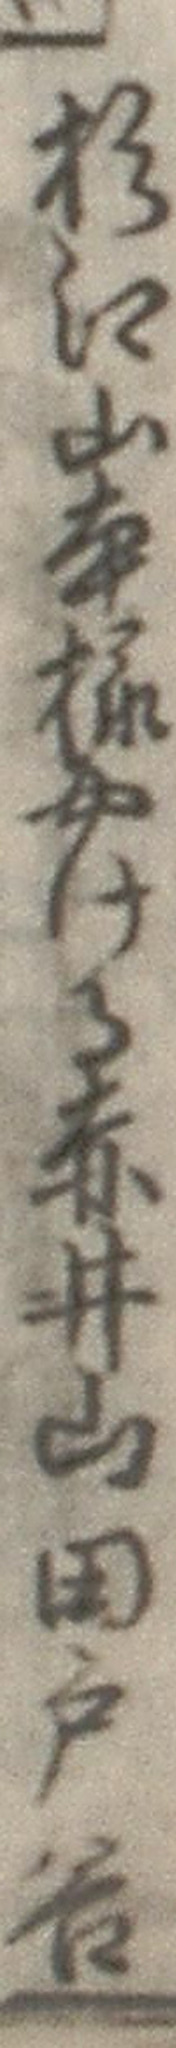杉江山本様やける赤井山田戸谷
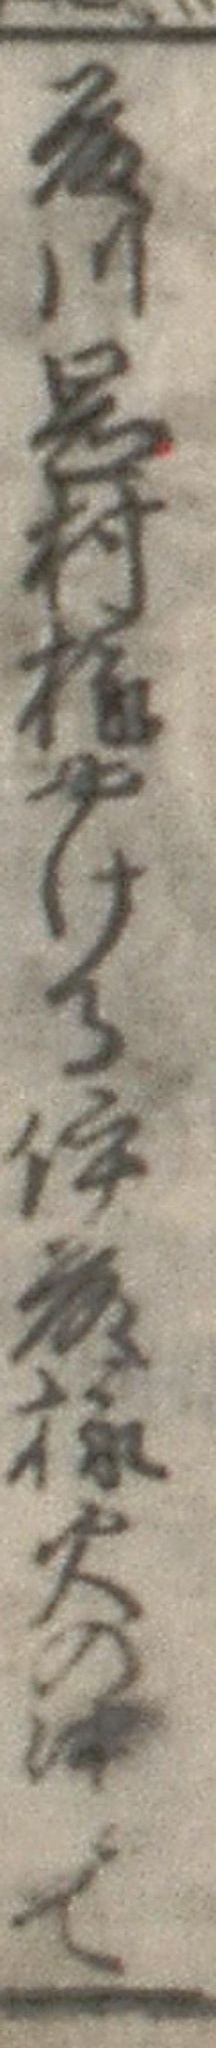藤川岡村様やける伊藤様火の中にて
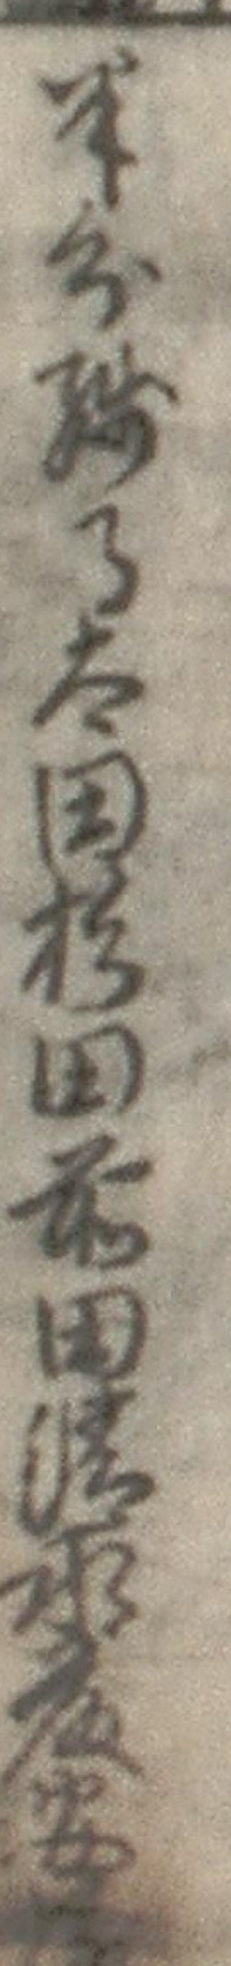半分残る太田杉田前田清水藤安様

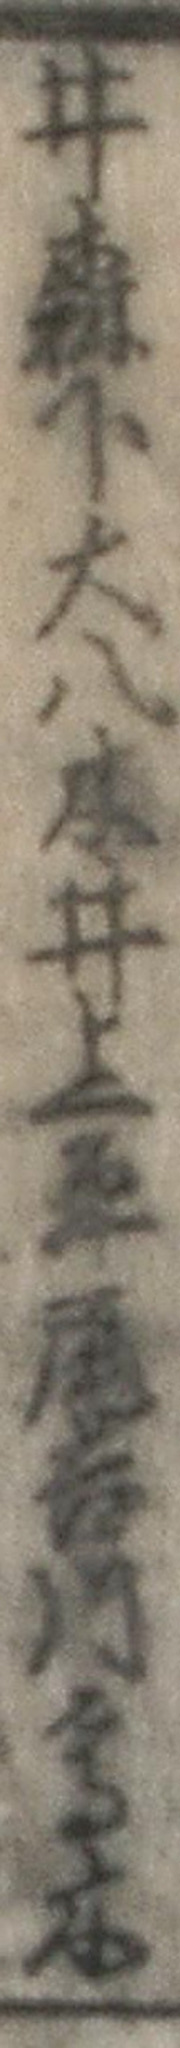井森下大八木井上平尾𠮷川高木
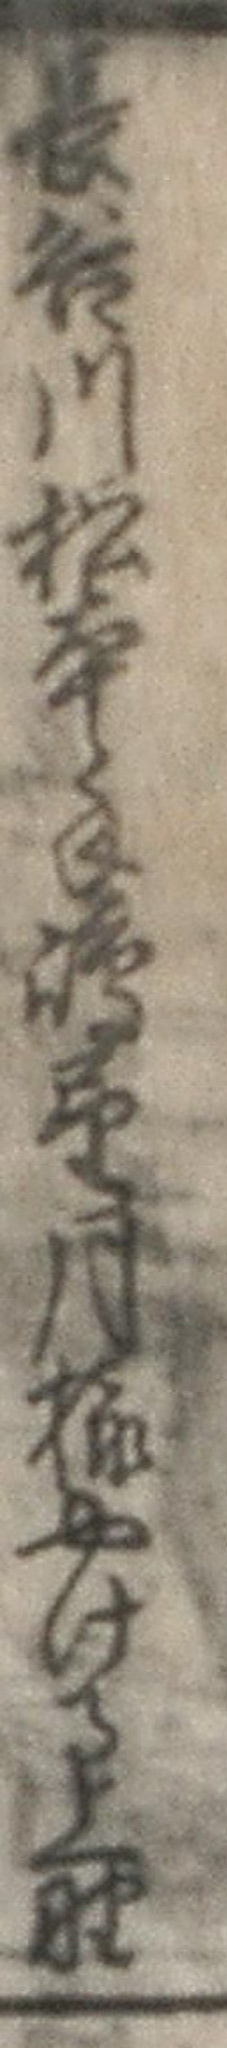長谷川松本手島望月様やける上野
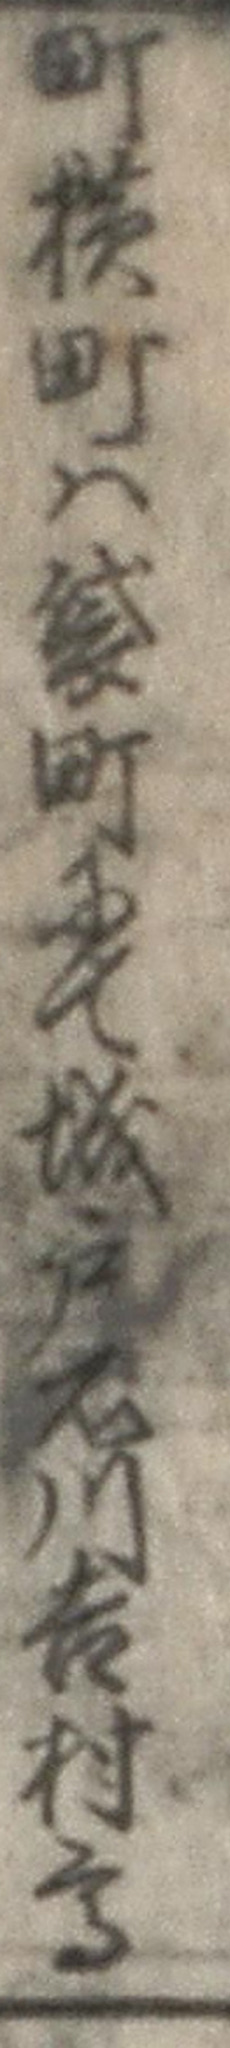町横町は袋町にて城戸石川吉村高
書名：江戸大地震末代鑑
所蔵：東京大学地震研究所図書室 Earthquake Research Institute Library, The University of Tokyo, JAPAN
